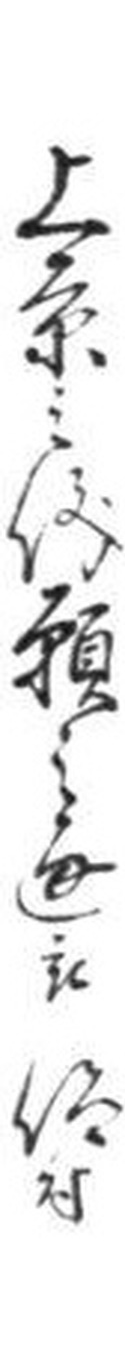上京之儀願之通被仰付
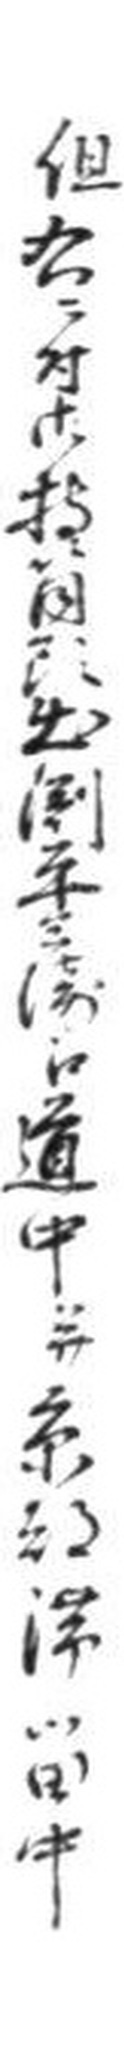但右ニ付御持筒頭出渕平兵衛江道中并京都滞留中
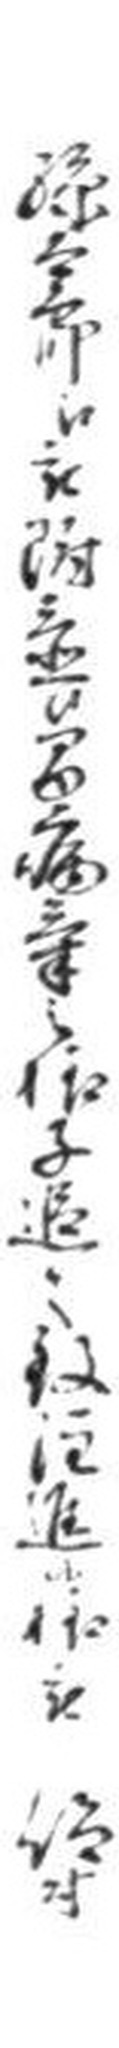孫太郎江被附置候間病気之様子追々致注進候様被仰付
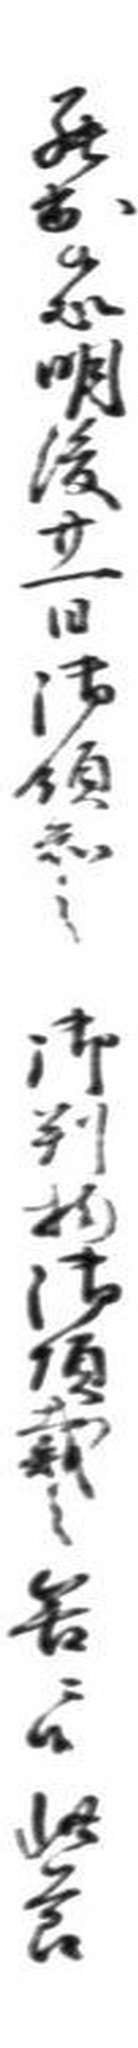罷出候処明後廿一日御領知之御判物御頂戴之筈ニ候此節
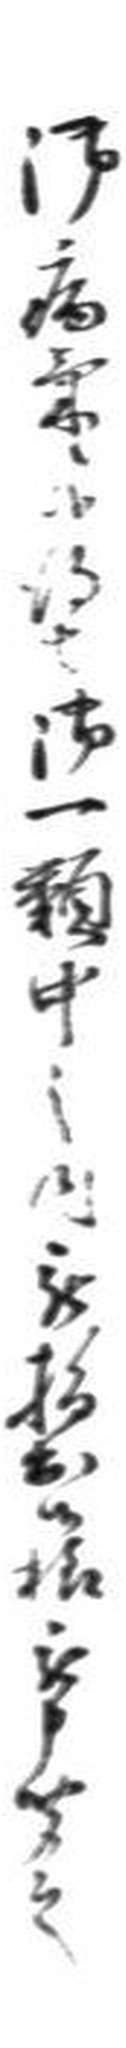御病気ニ候得者御一類中之内被指出候様被申聞之
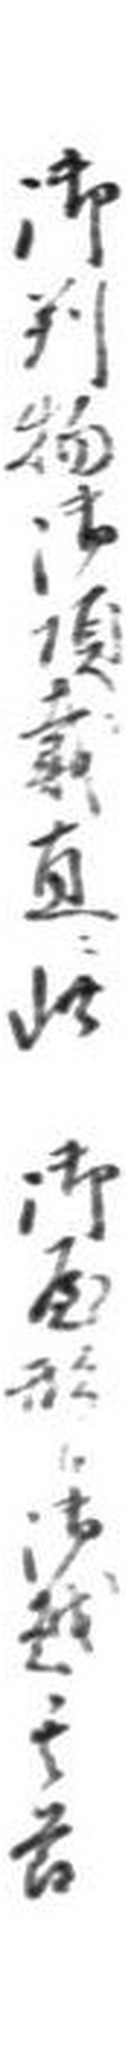御判物御頂戴直ニ此御屋形江御越其節
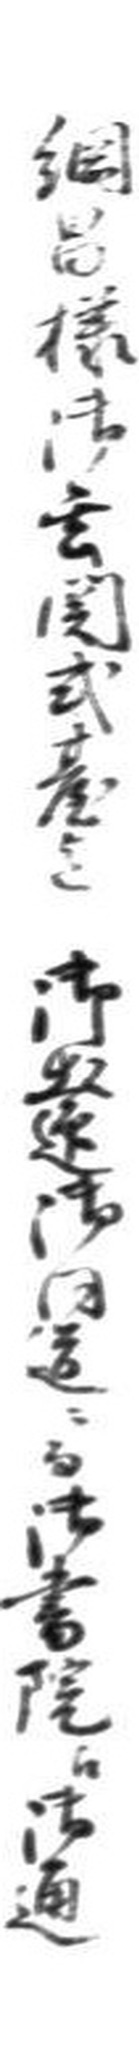綱昌様御玄関式台迄御出迎御同道ニ而御書院江御通
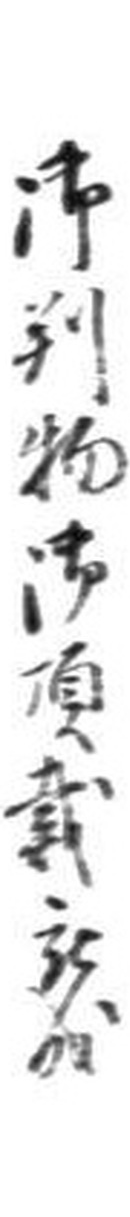御判物御頂戴被成
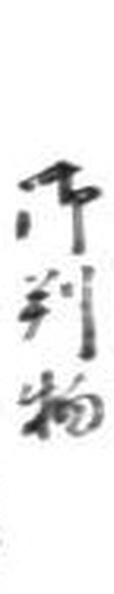御判物
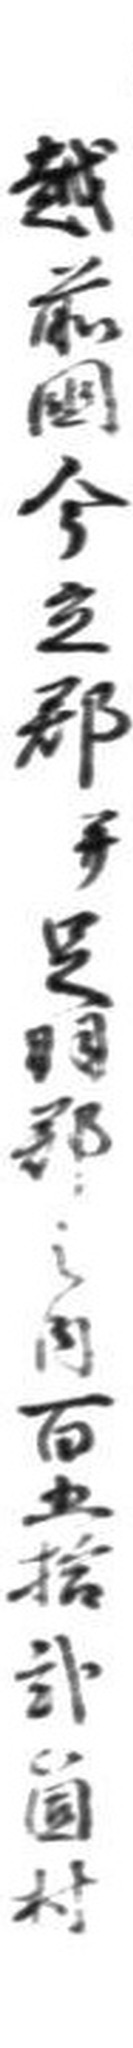越前国今立郡并足羽郡之内百五拾弐箇村

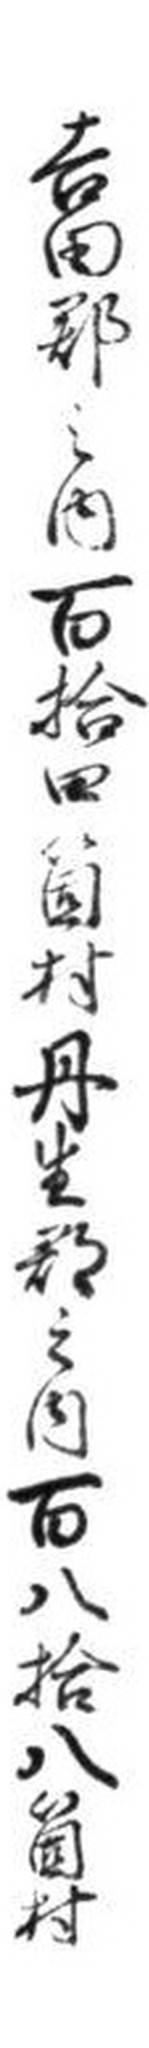吉田郡之内百拾四箇村丹生郡之内百八拾八箇村
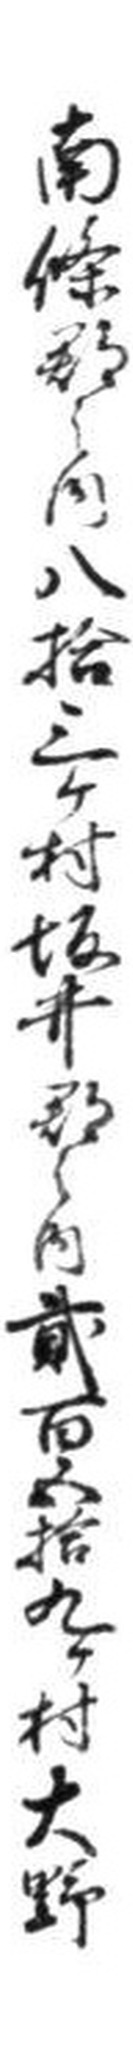南条郡之内八拾三ヶ村坂井郡之内弐百五拾九ヶ村大野
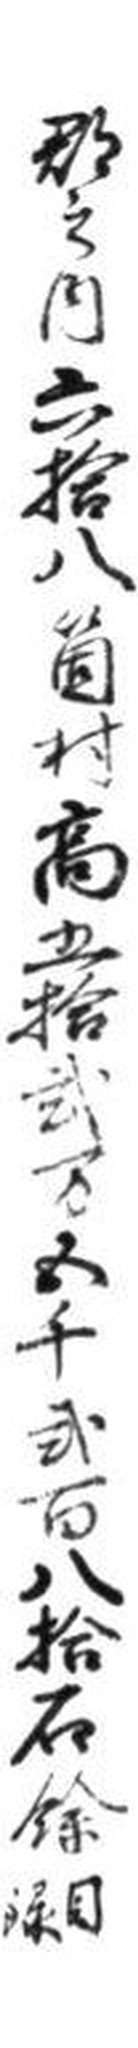郡之内六拾八箇村高五拾弐万五千弐百八拾石余目録
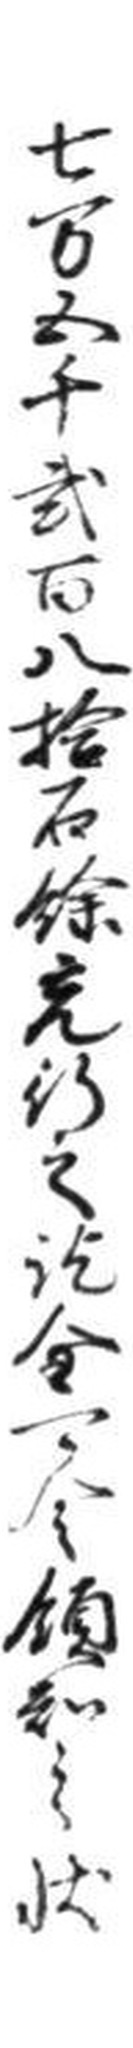七万五千弐百八拾石余充行之訖全可令領知之状
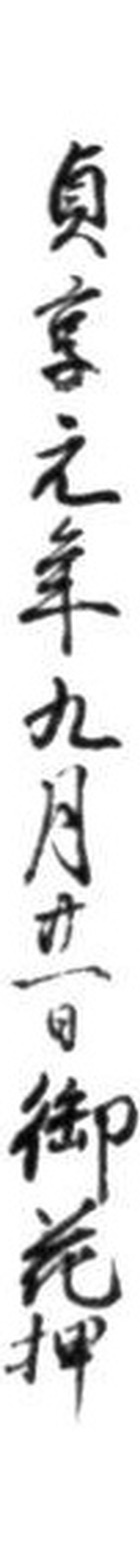貞享元年九月廿一日御花押
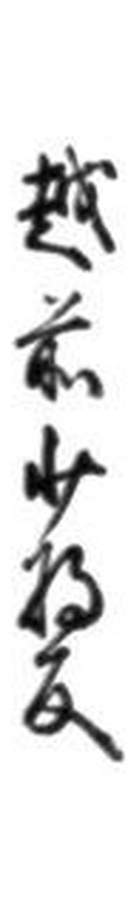越前少将殿
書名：家譜 十五 綱昌公 従天和元年到元禄十二年
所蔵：福井県文書館 Fukui Prefectural Archives
